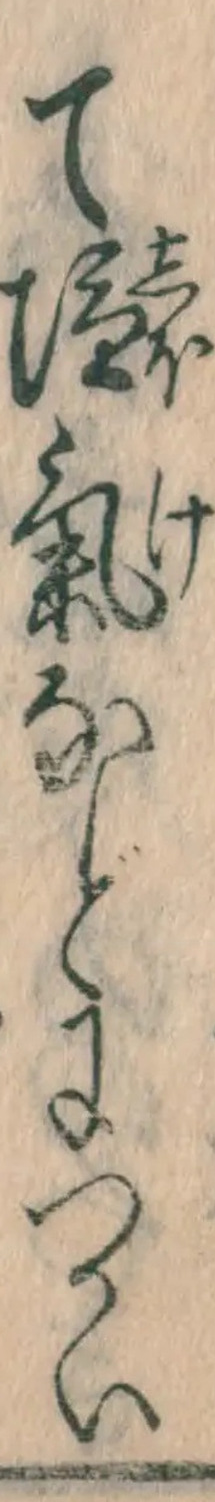て塩気などにつかい
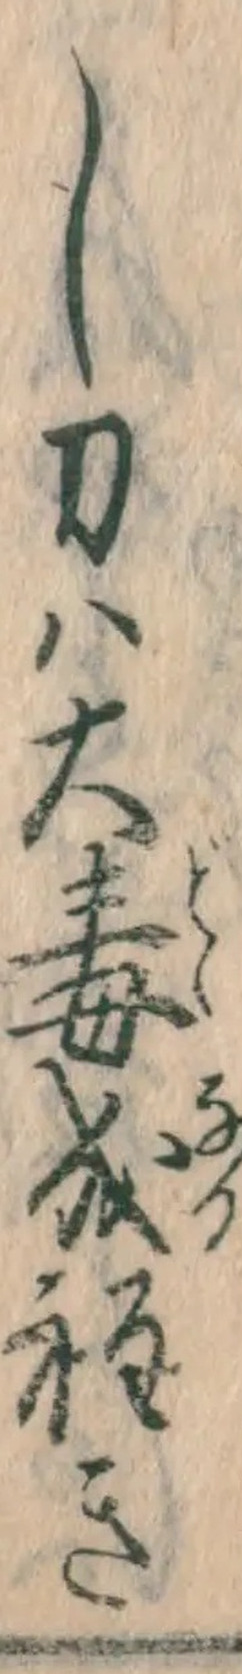し刀は大毒成程き
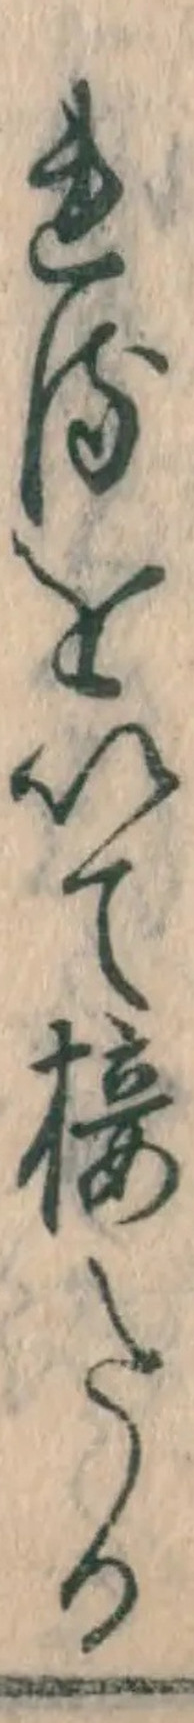れるを以て接たる
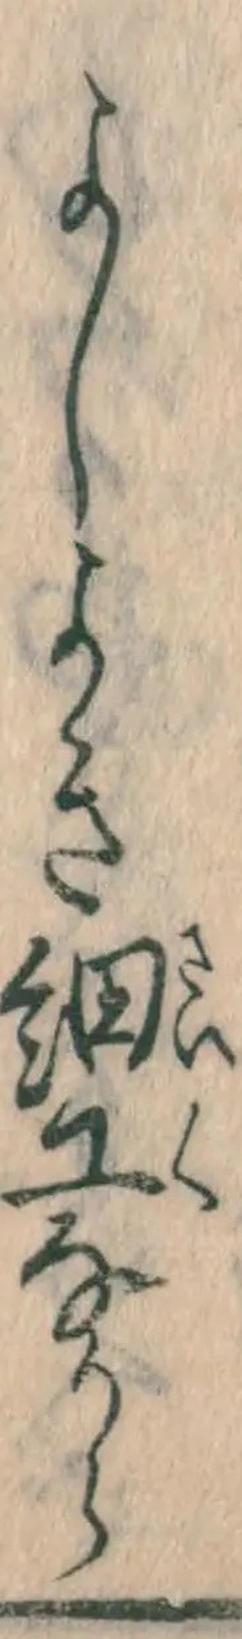よしよき細工なから
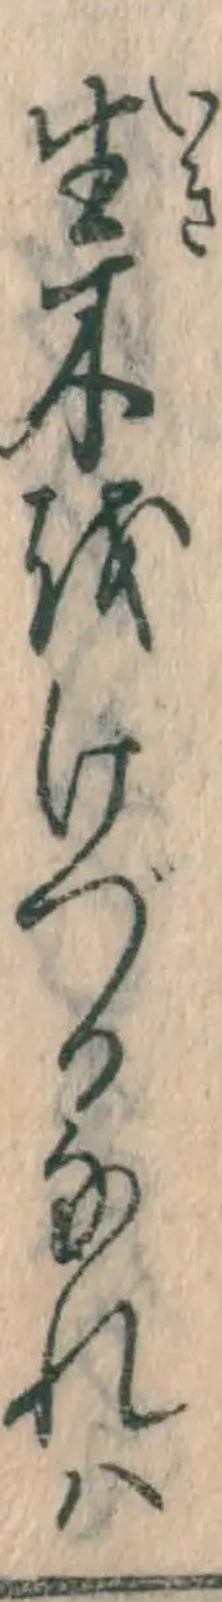生木をけづるなれは
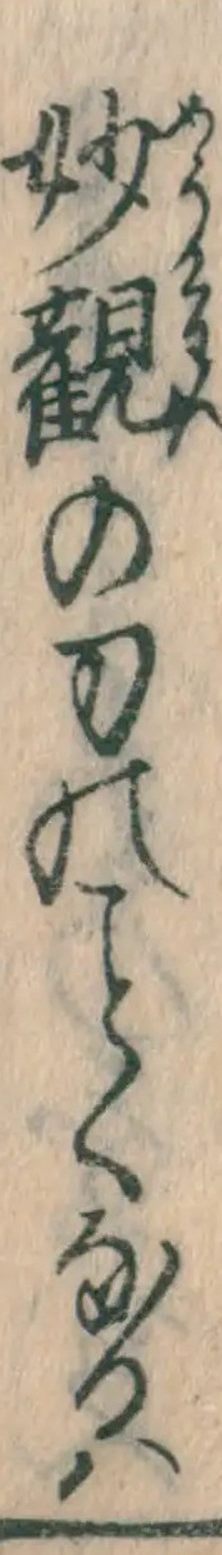妙観の刀のことくなるは

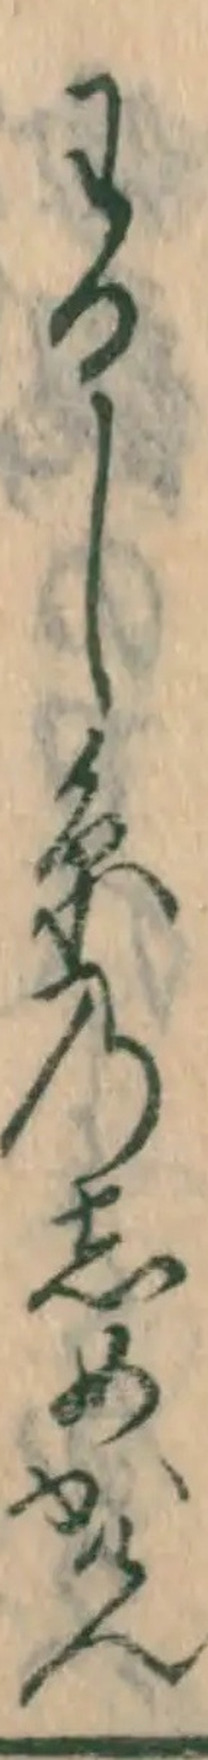わるし糸のしめかけん
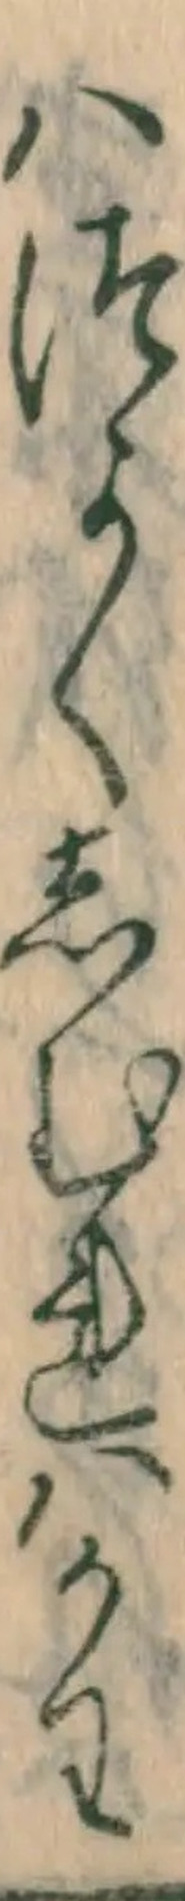はつよくしむれはかわ
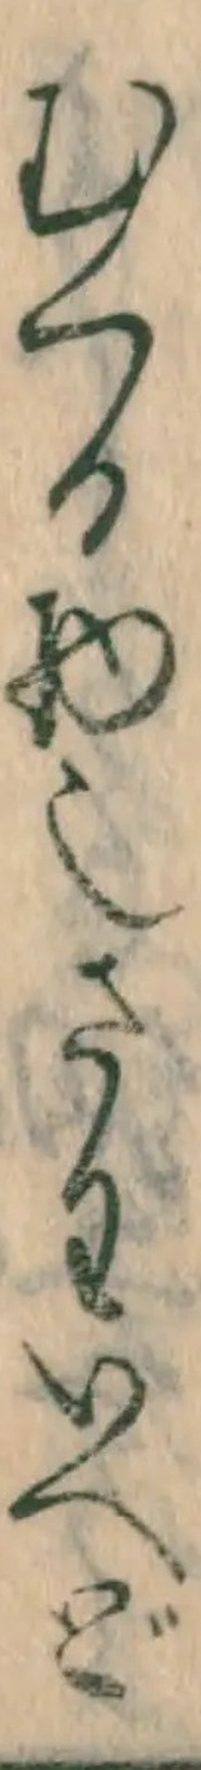むくる物也さわいへど
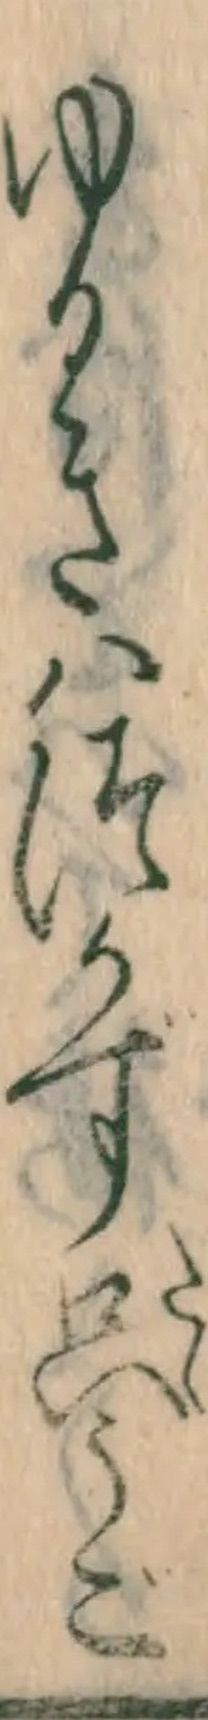ゆるきはつかず只うご
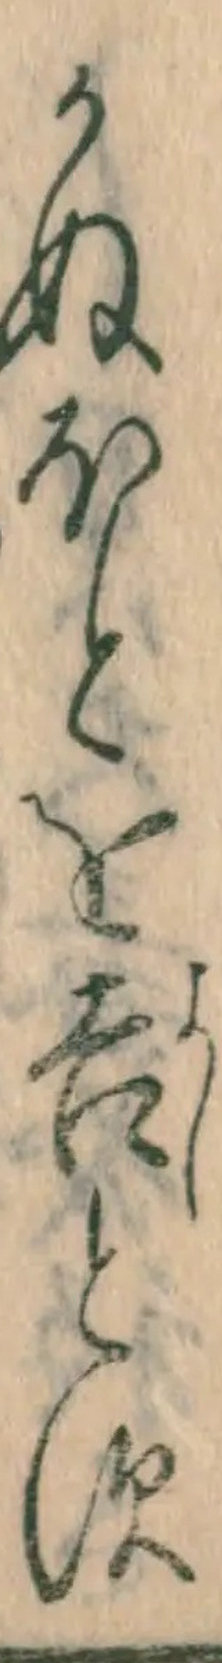かぬほとを吉とす
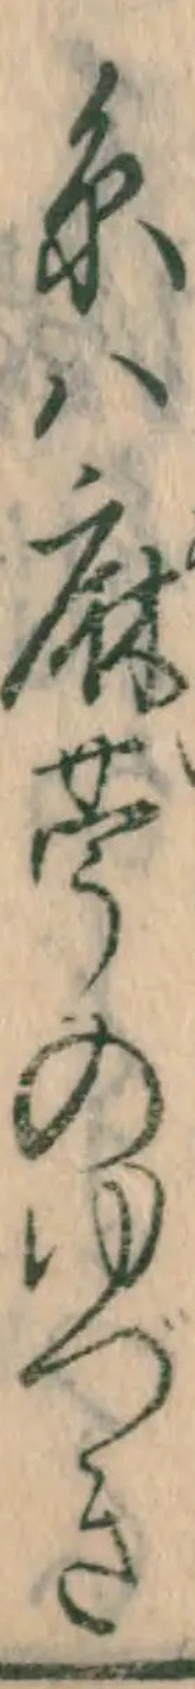糸は麻苧のゆづき
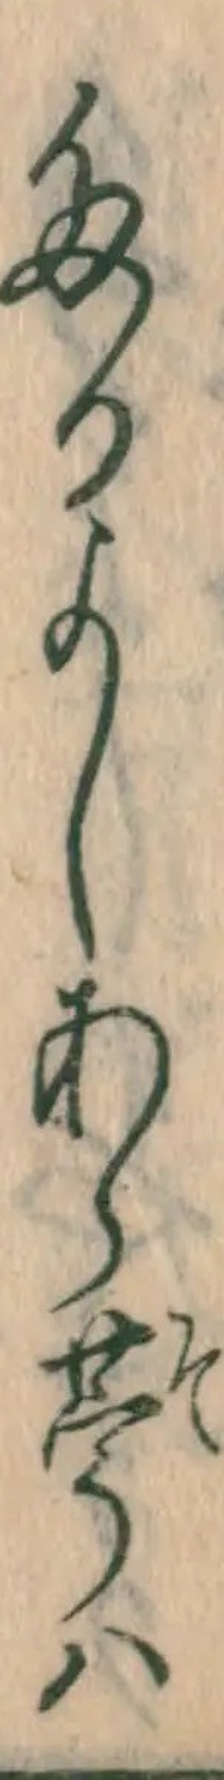たるよしあら苧は
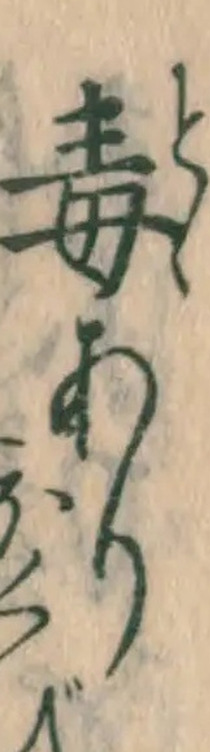毒あり
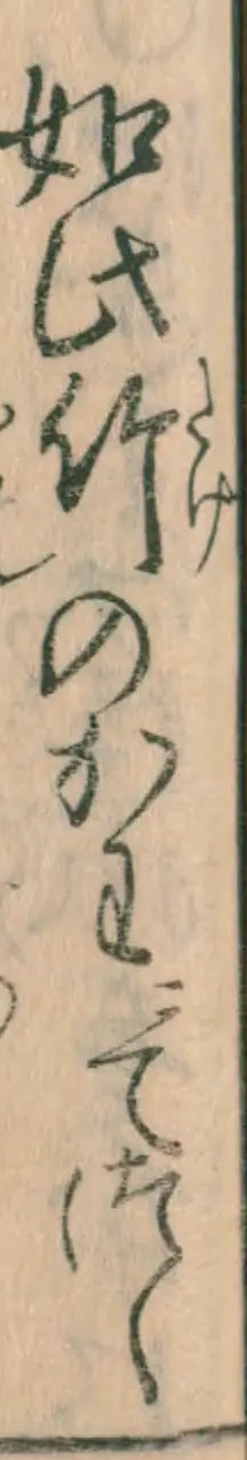如此竹のかわゝ
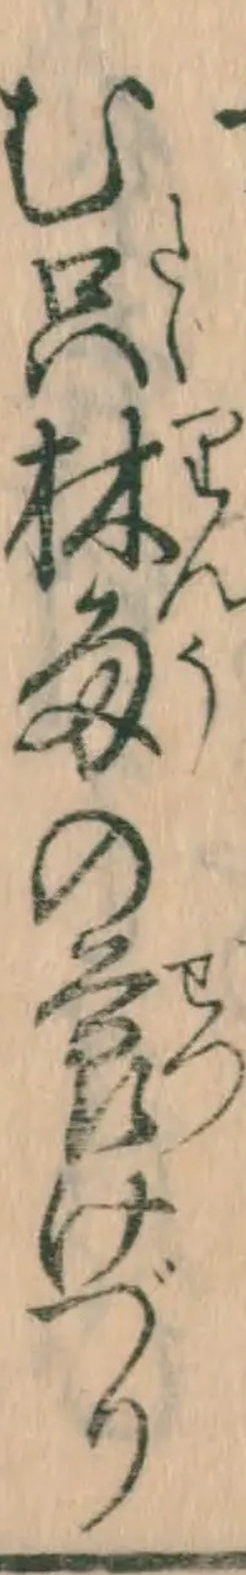む只林雨の節けづり
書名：錦繍枕 5巻. [5]
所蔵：国立国会図書館 National Diet Library, JAPAN
